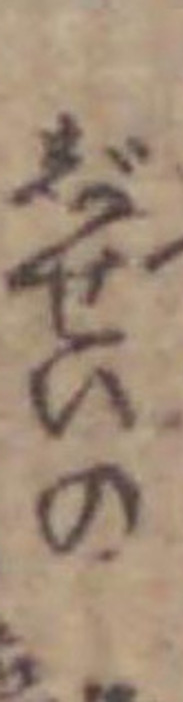じせいの
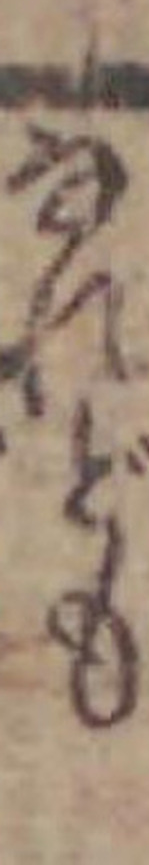なれども
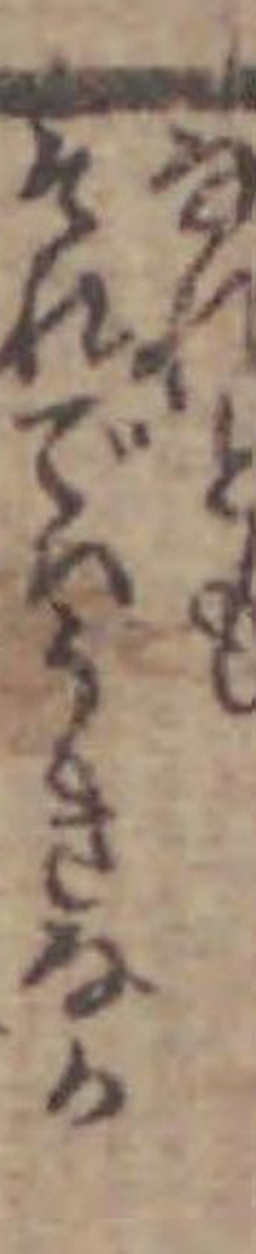それではうきなか
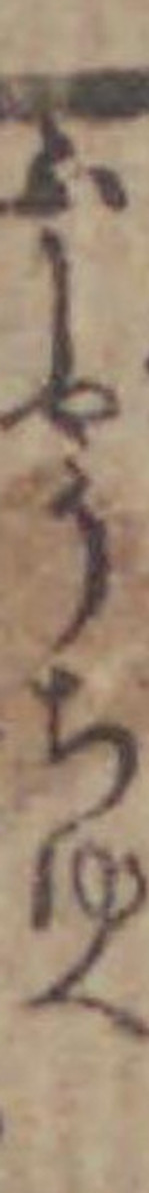ふしやうちゆへ
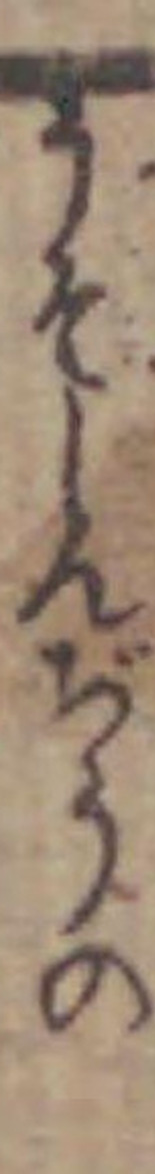うそしんぢうの
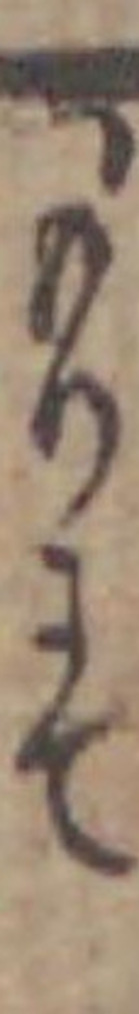つもりにて
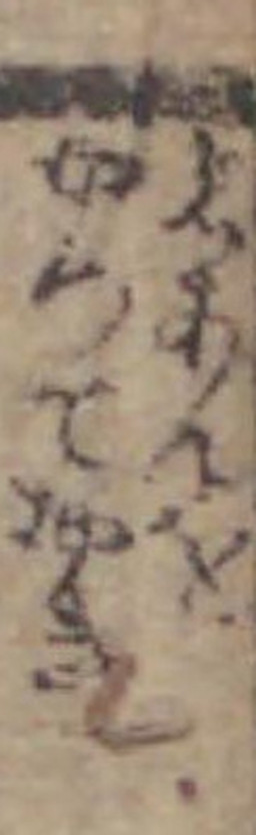やつておき
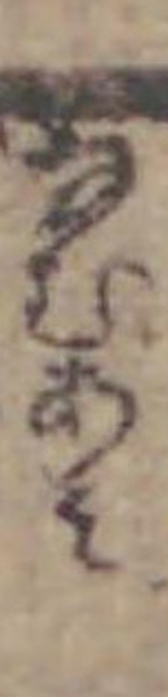なむあみ
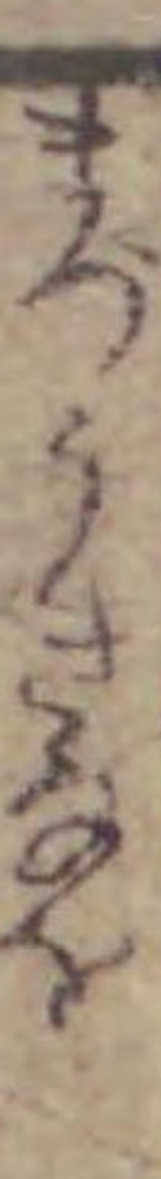まづうきなを
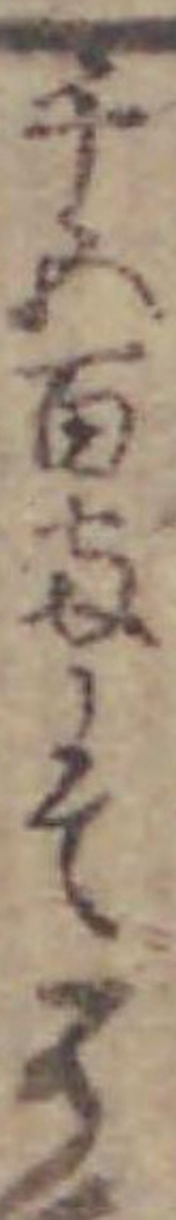千五百両にて
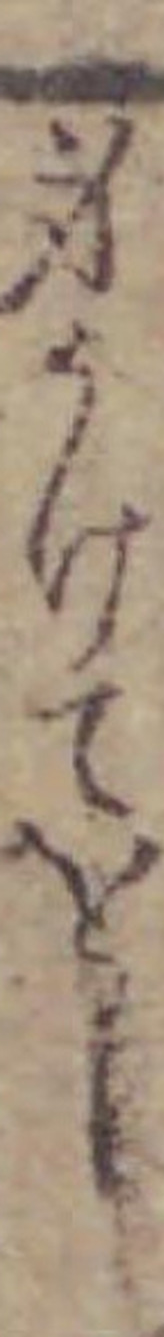身うけてをし
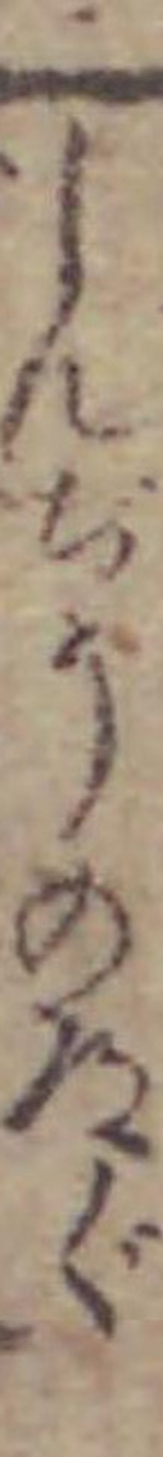しんぢうの道ぐ
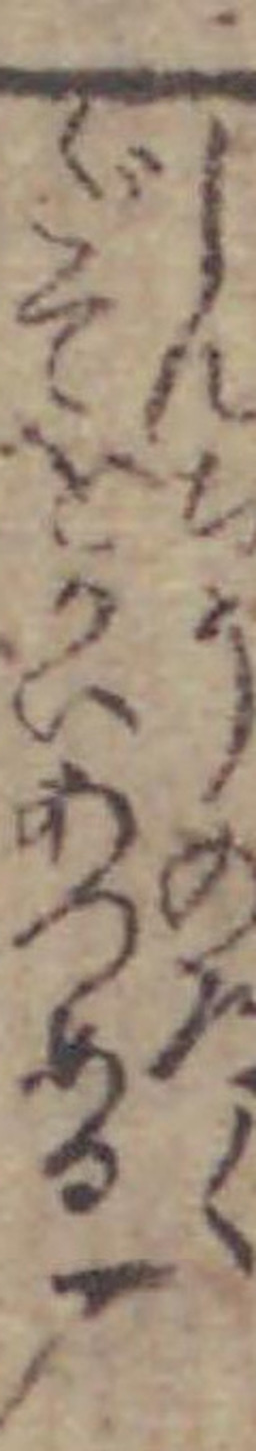だてをかいあつめる
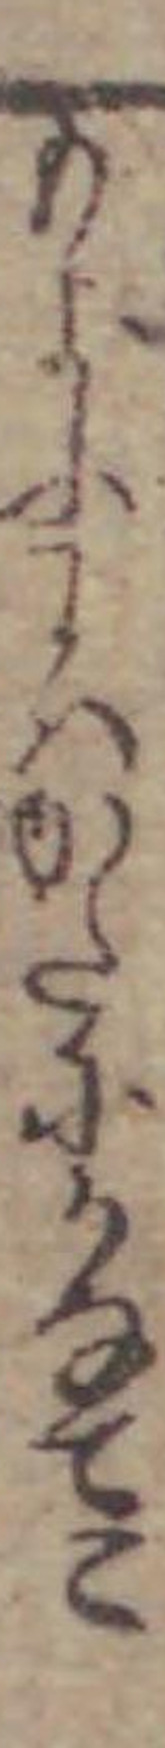もよふにはかたにかなてこ
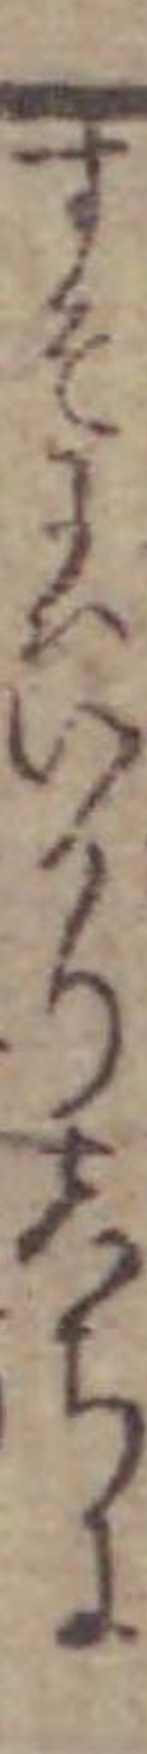すそにはいかりしちに
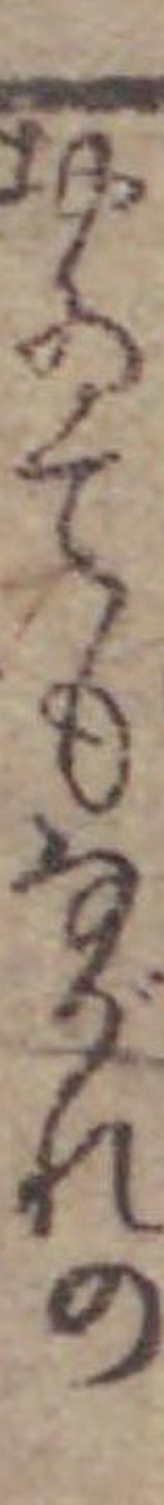おゐてもながれの
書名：江戸生艶気樺焼 : 3巻
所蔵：国立国会図書館 National Diet Library, JAPAN
